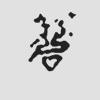箸
